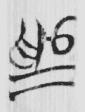爲
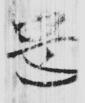是
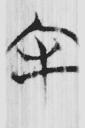牢
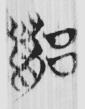{鼠呂}
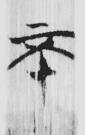不
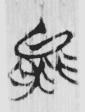能
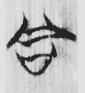同
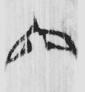穴
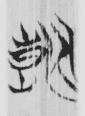朝
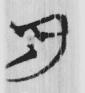夕
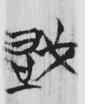{豆戈}
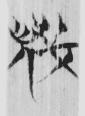{兒戈}
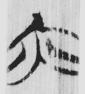亦
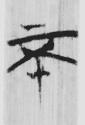不
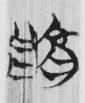{爿兔}
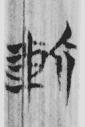斬
